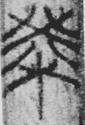楑（睽）
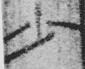少（小）
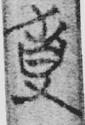事
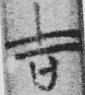吉
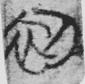初
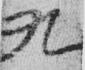九
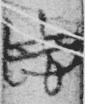悔
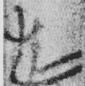喪
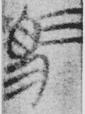馬
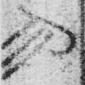勿
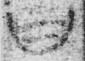由（逐）
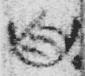自
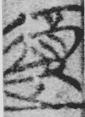○（復）
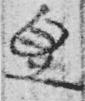見
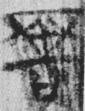○（惡）
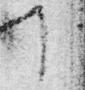人
